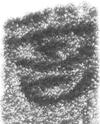言
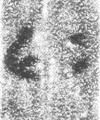㠯（以）
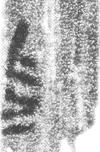爲
